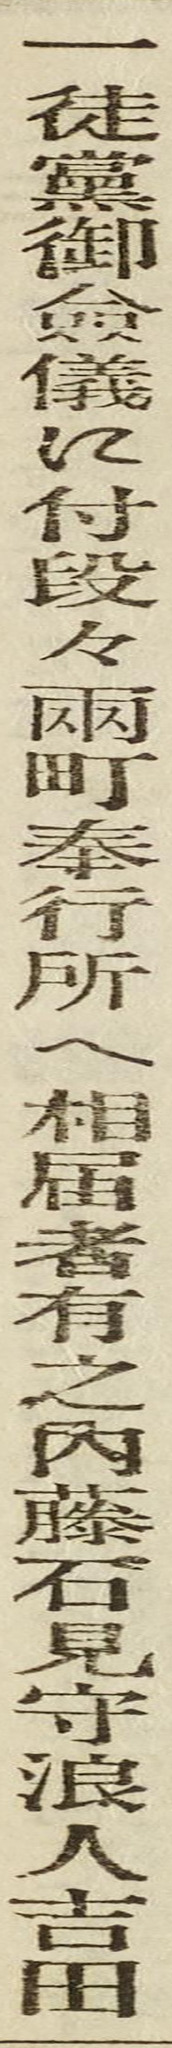一徒党御詮議に付段々両町奉行所へ相届者有之内藤石見守浪人吉田
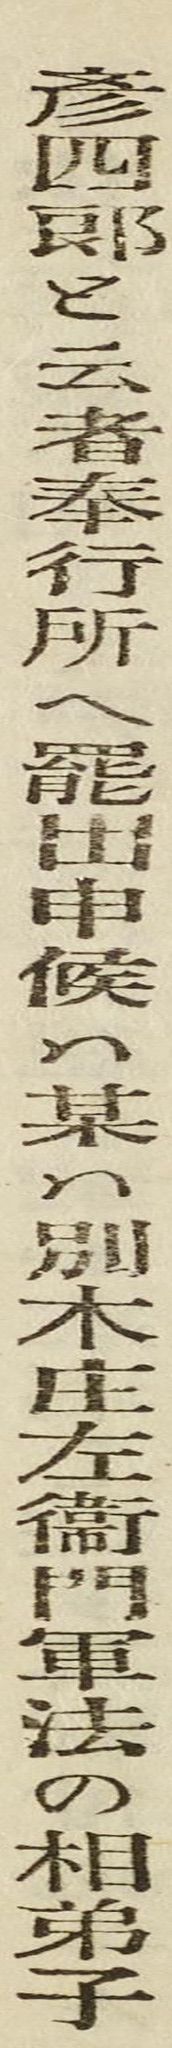彦四郎と云者奉行所へ罷出申候は某は別木庄左衞門軍法の相弟子
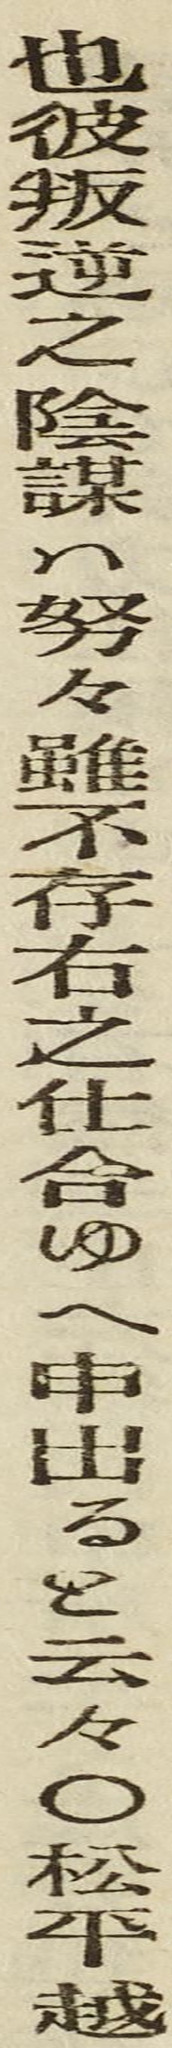也彼叛逆之陰謀は努々雖不存右之仕合ゆへ申出ると云々〇松平越
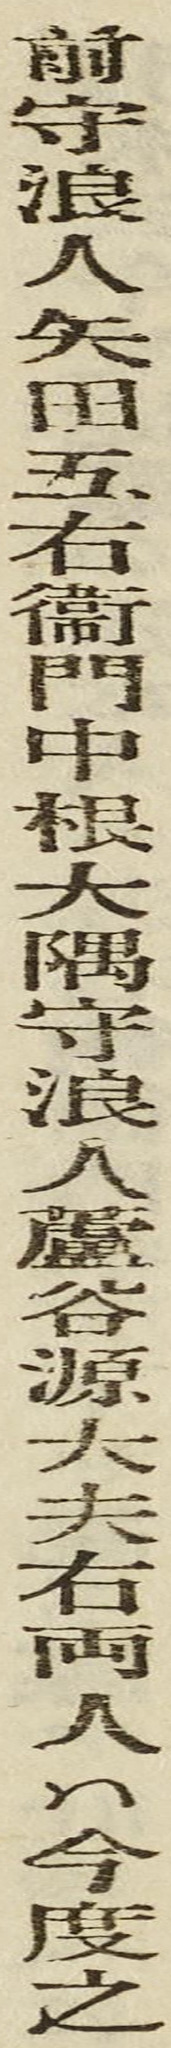前守浪人矢田五右衞門中根大隅守浪人芦谷源大夫右両人は今度之
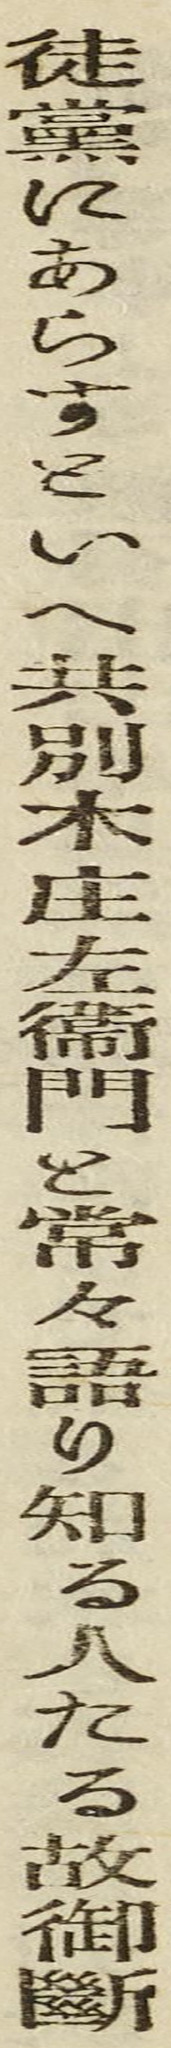徒党にあらすといへ共別木庄左衞門と常々語り知る人たる故御断
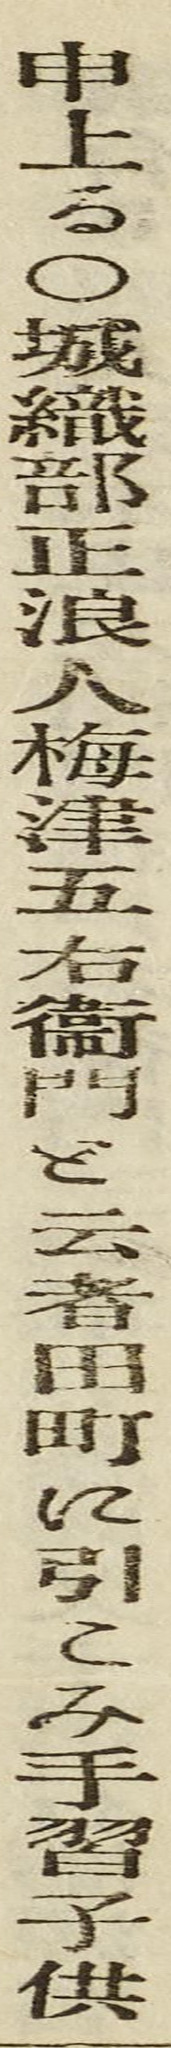申上る〇城織部正浪人梅津五右衞門と云者田町に引こみ手習子供
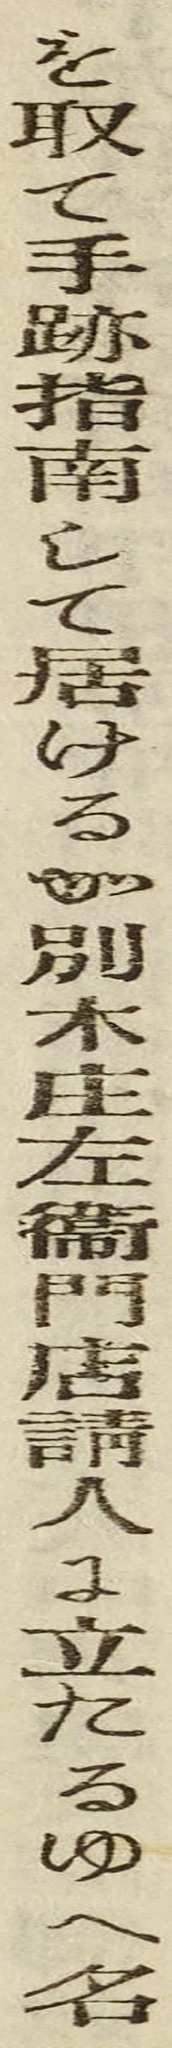を取て手跡指南して居けるか別木庄左衞門店請人に立たるゆへ名
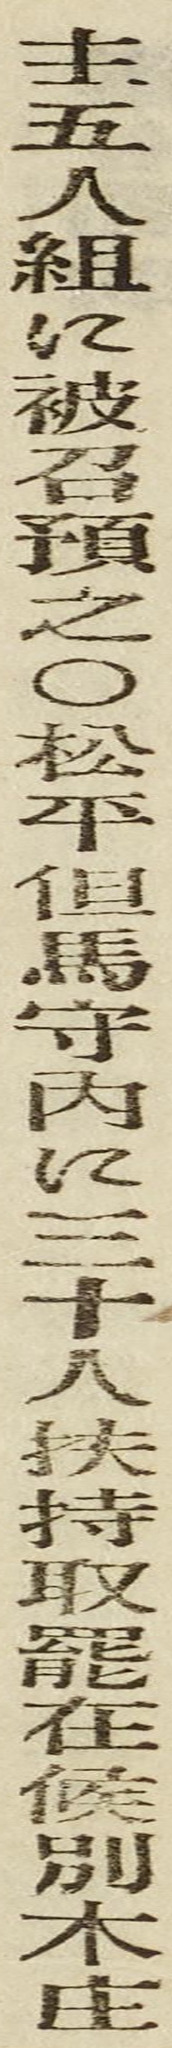主五人組に被召預之〇松平但馬守内に三十人扶持取罷在候別木庄
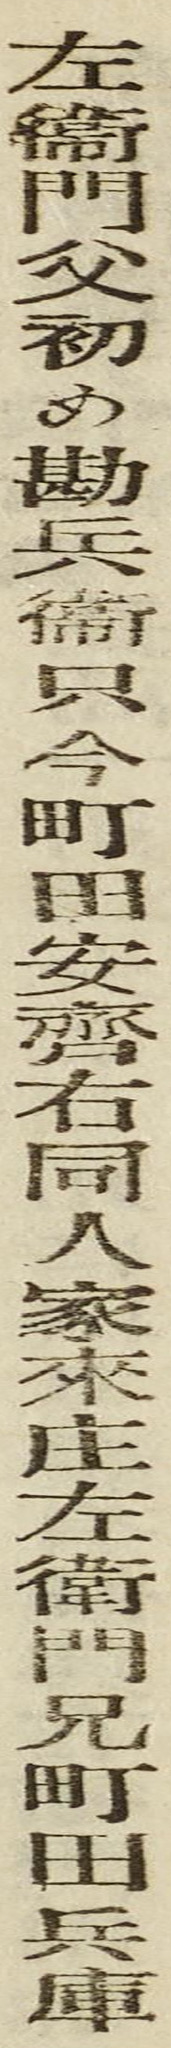左衛門父初め勘兵衛只今町田安斉右同人家来庄左衛門兄町田兵庫
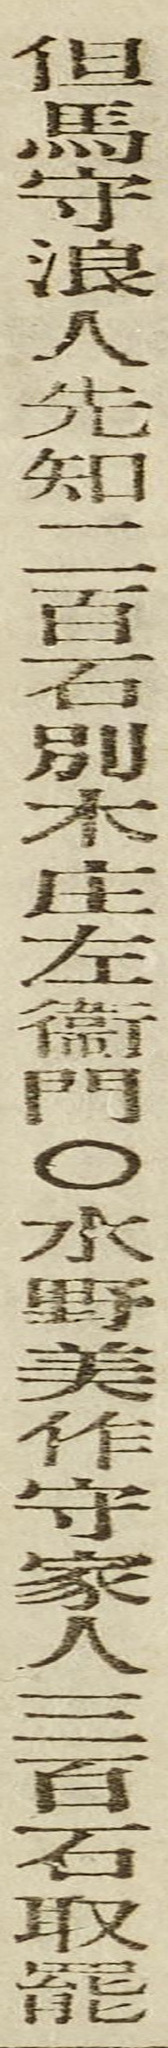但馬守浪人先知二百石別木庄左衞門〇水野美作守家人三百石取罷
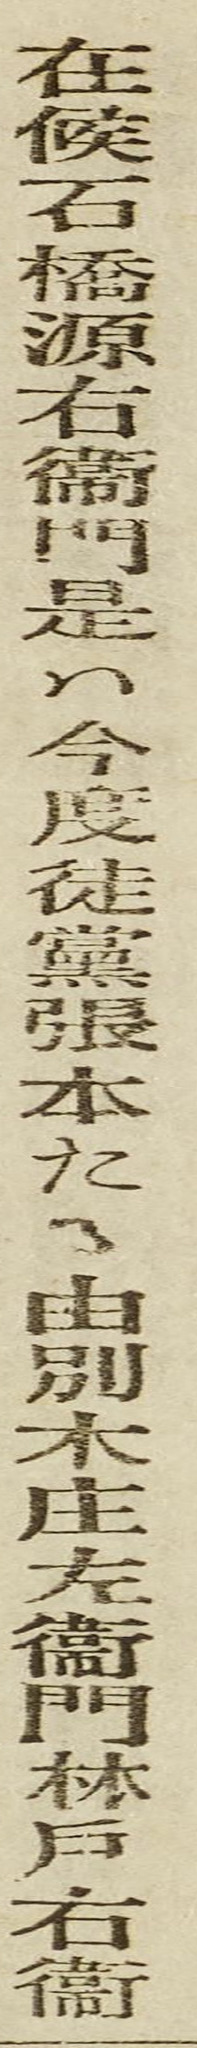在候石橋源右衞門是は今度徒党張本たる由別木庄左衞門林戸右衞

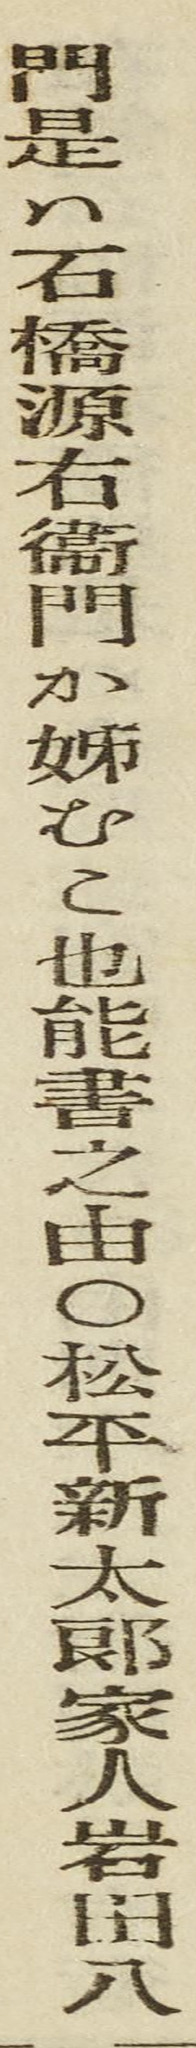門是は石橋源右衞門か姉むこ也能書之由〇松平新太郎家人岩田八
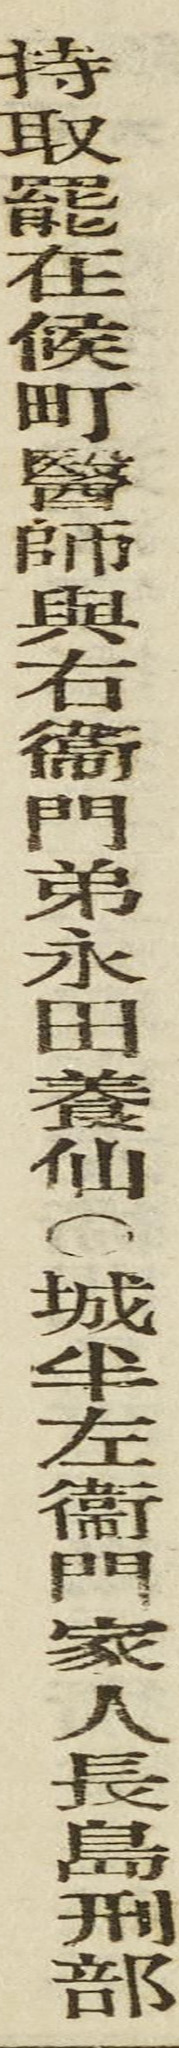持取罷在候町医師与右衛門弟永田養仙〇城半左衞門家人長島刑部
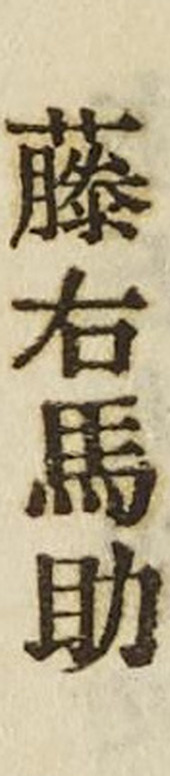藤右馬助
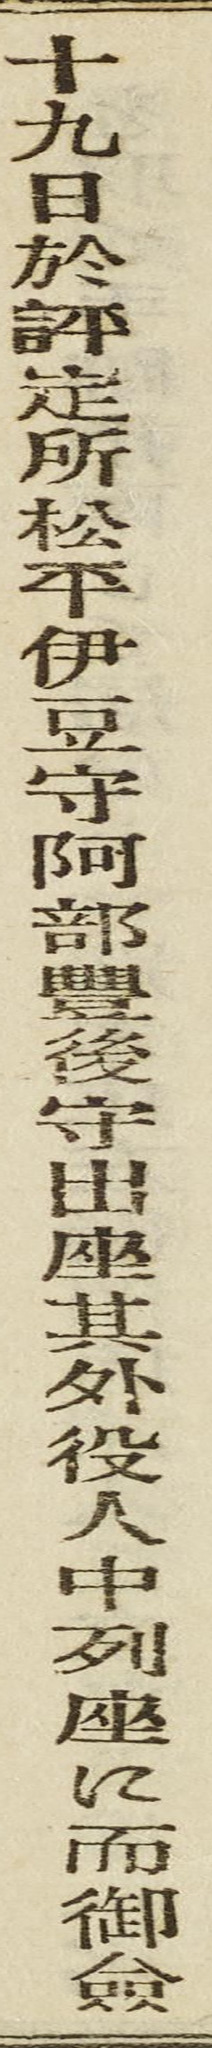十九日於評定所松平伊豆守阿部豊後守出座其外役人中列座に而御詮
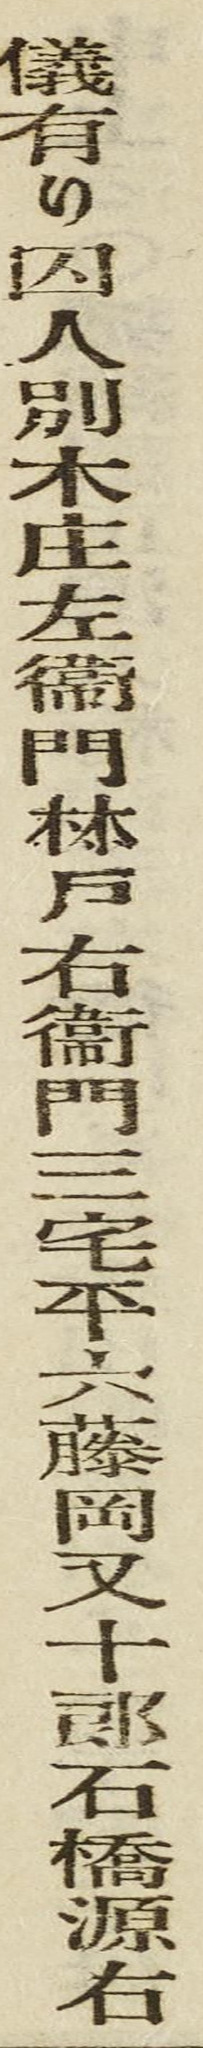儀有り囚人別木庄左衞門林戸右衞門三宅平六藤岡又十郎石橋源右
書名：史籍集覽　朝鮮陣古文・細井廣澤記・颶風紀事・天明七年將軍宣下次第書　全
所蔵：東京大学地震研究所図書室 Earthquake Research Institute Library, The University of Tokyo, JAPAN
